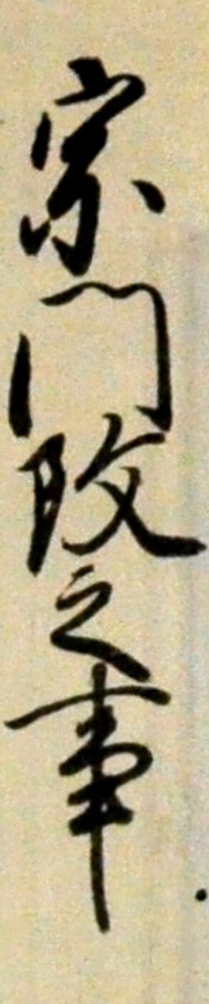宗門改之事
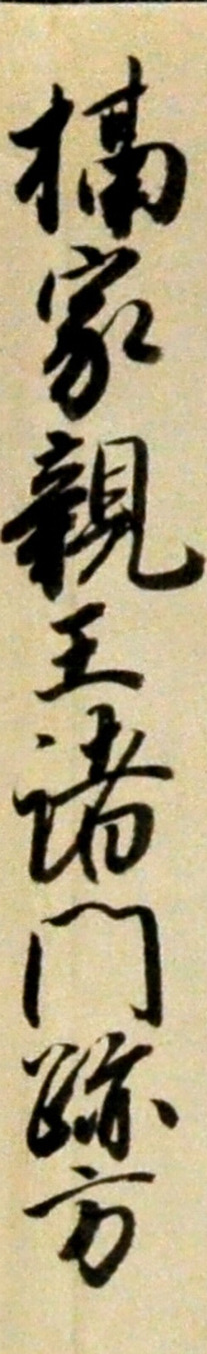摂家親王諸門跡方
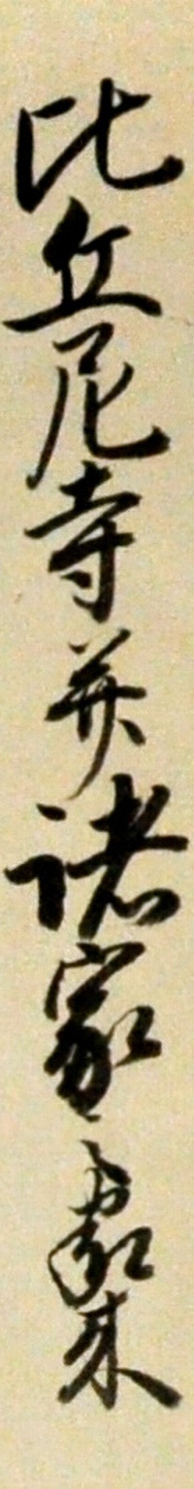比丘尼寺並諸家之家来
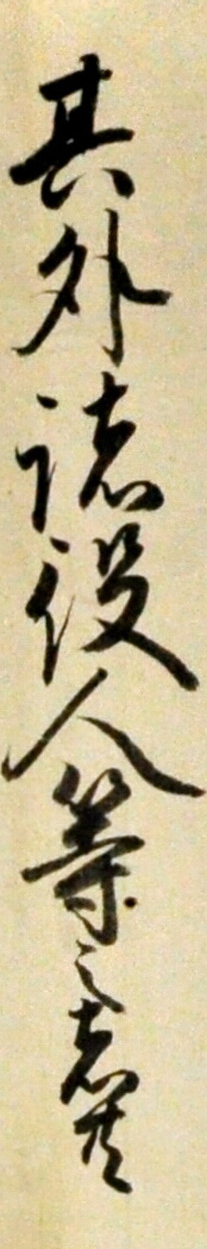其外諸役人等之者共
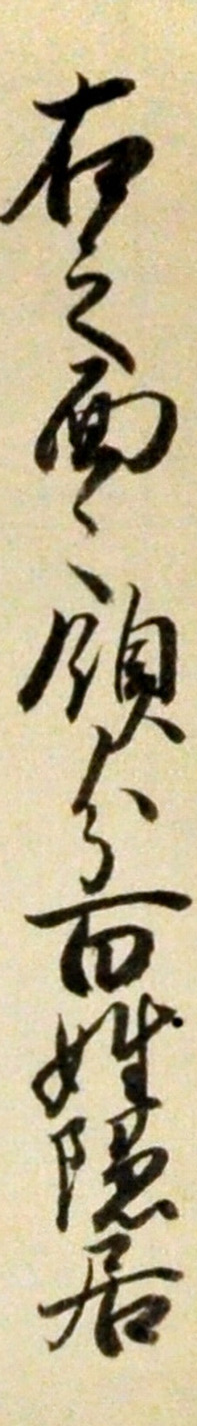右之面々領分百姓隠居
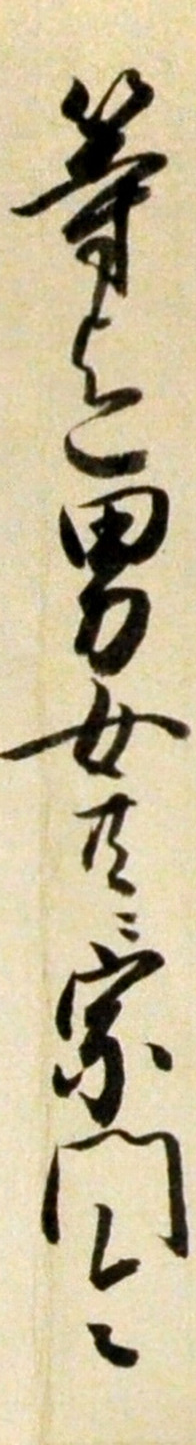等迄男女共二宗門令
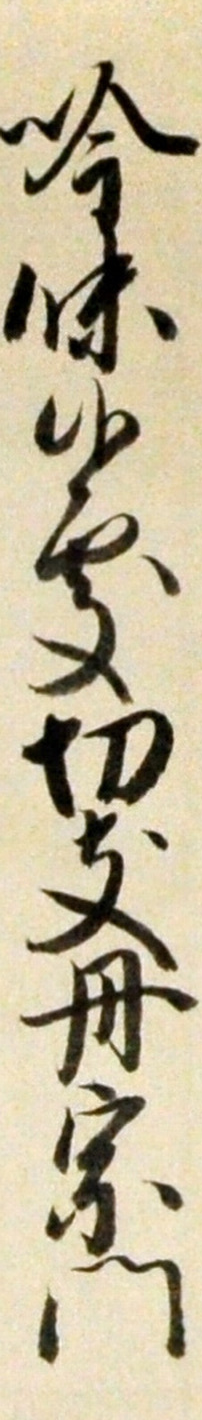吟味候處切支丹宗門
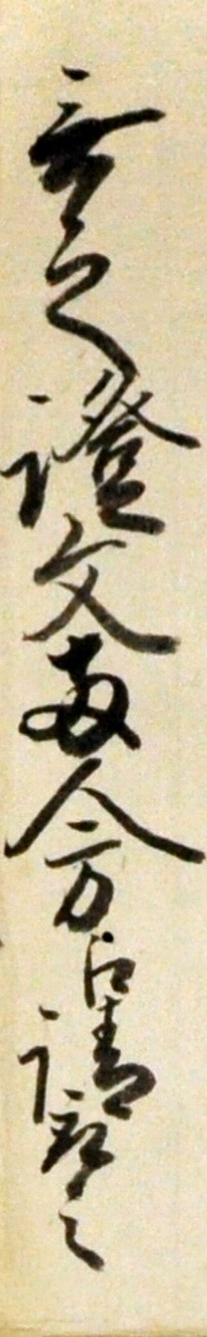無之證文両人方江請取之
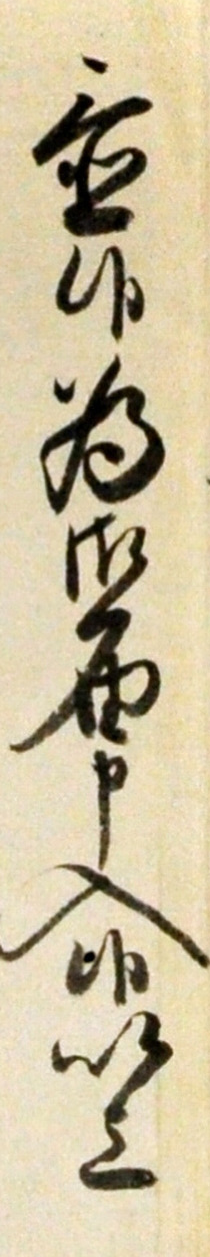置候為御届申入候以上
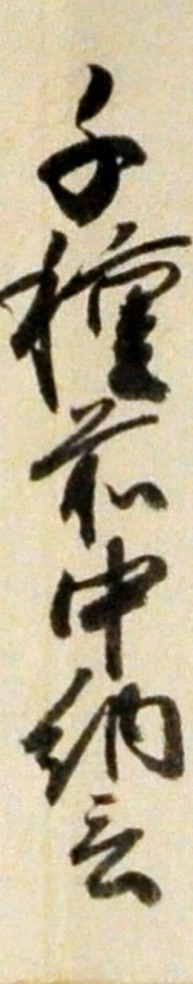千種前中納言
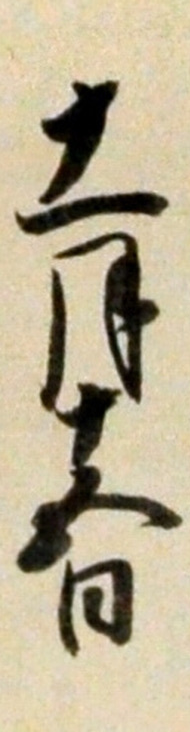十一月十五日
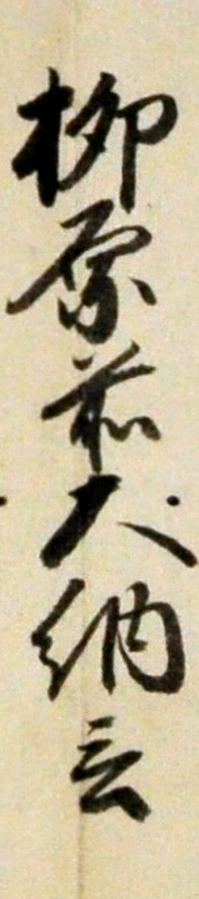柳原前大納言
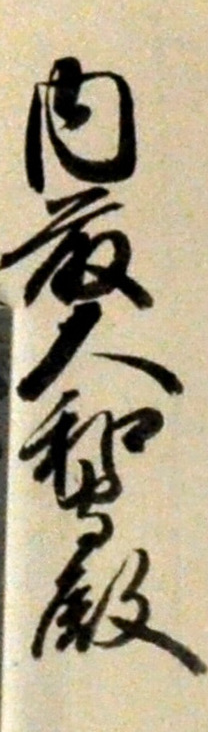内藤大和守殿
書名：宗門改之事
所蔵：伊那市立高遠町図書館・合同会社AMANE
